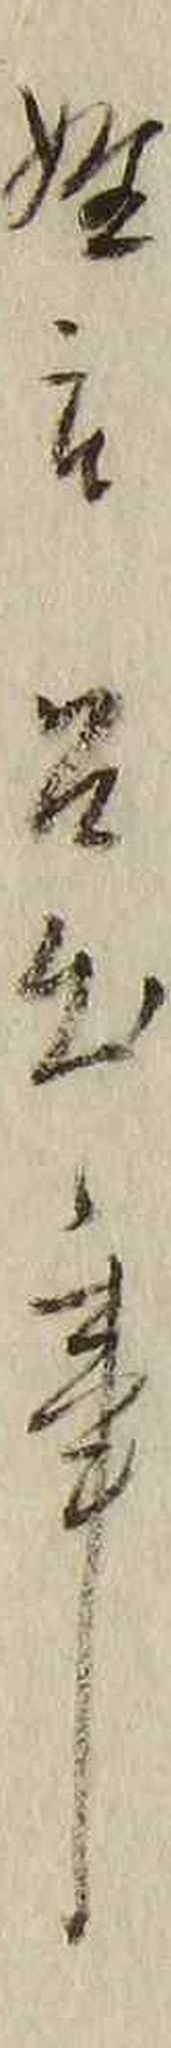姓被召出候事

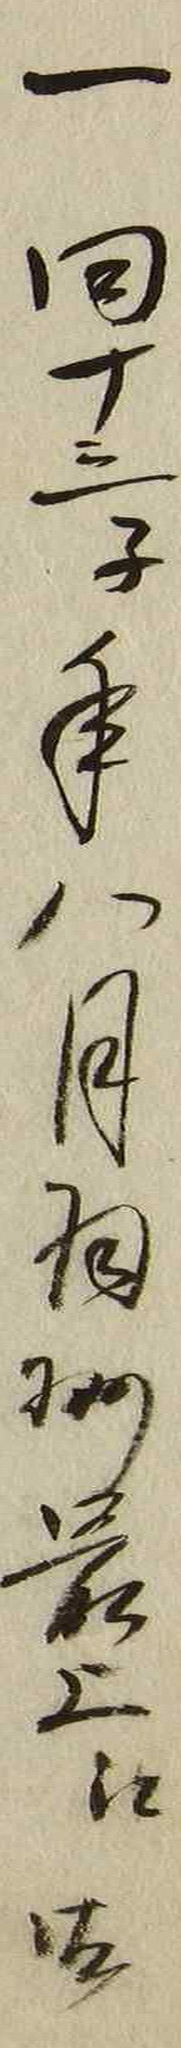一同十三子年八月羽州最上江御
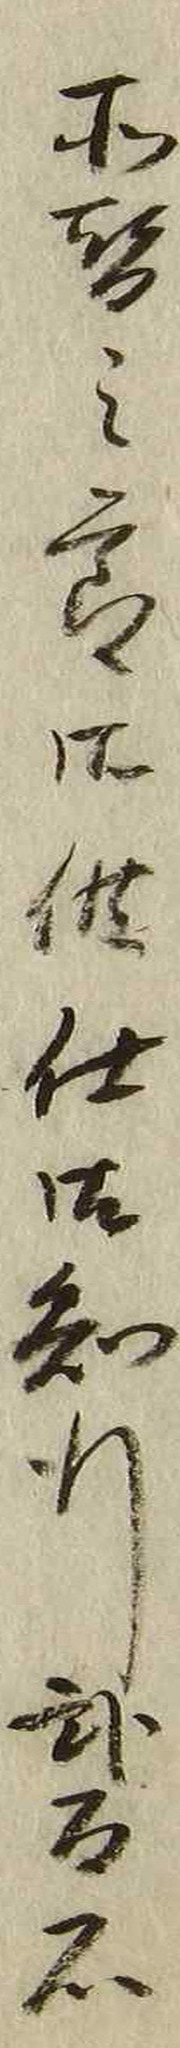所替之節御供仕御知行弐百石
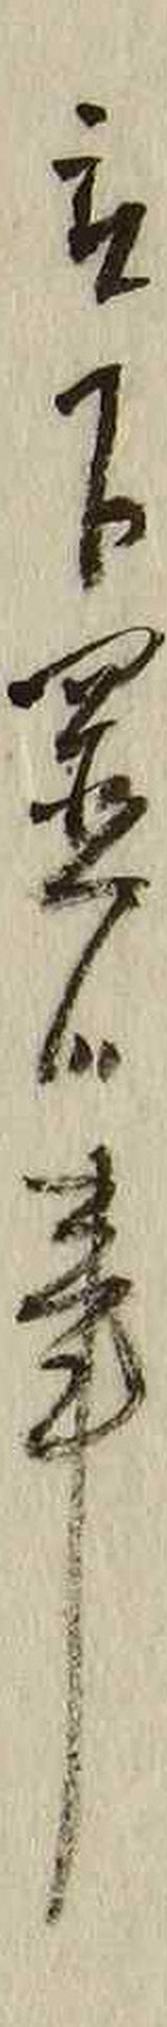被下置候事
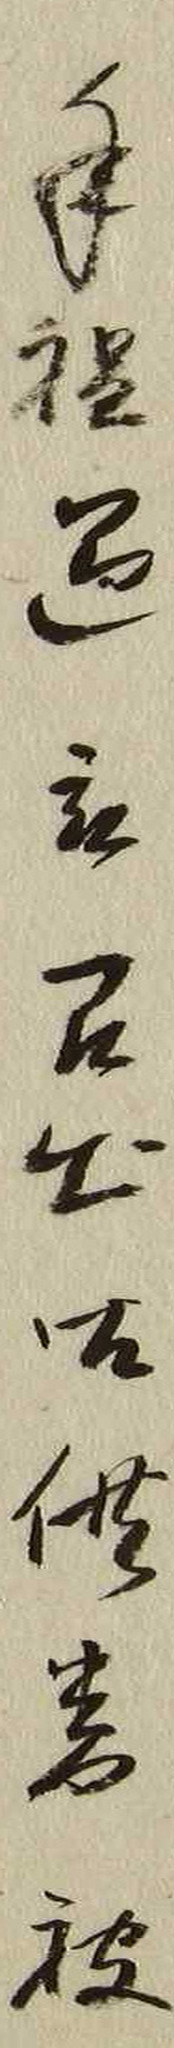年程過被召出御供番被
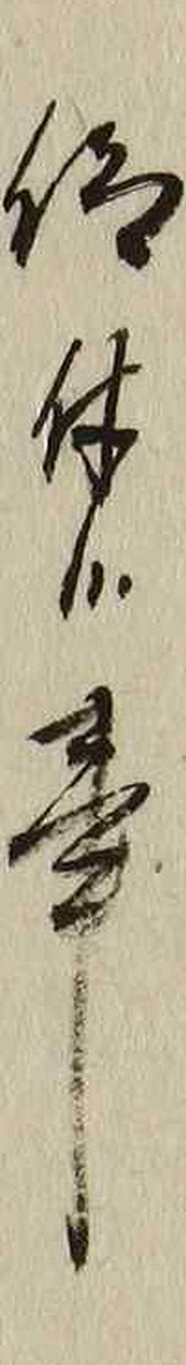仰付候事
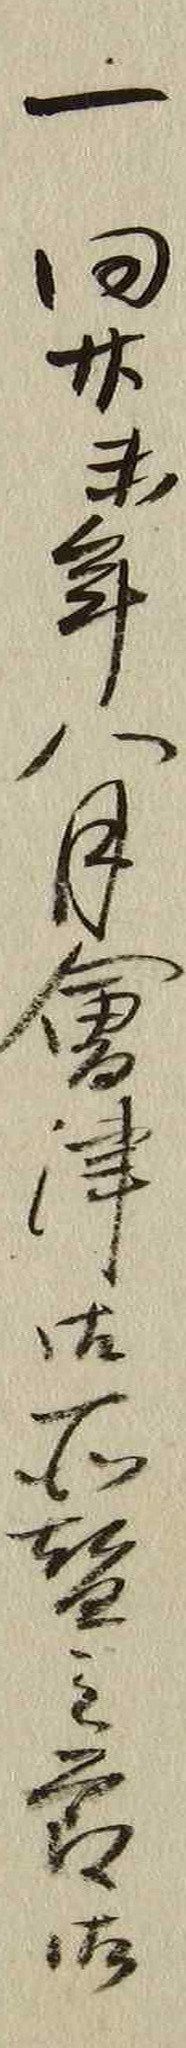一同廿未年八月会津御所替之節御
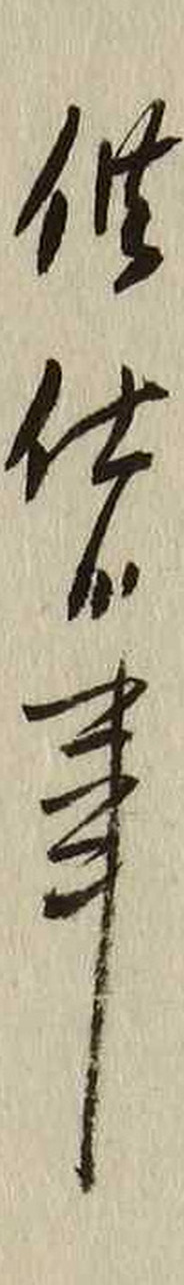供仕候事
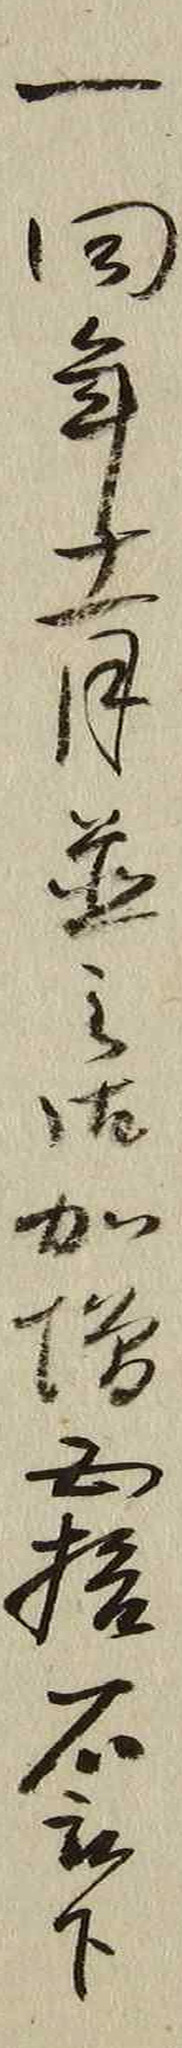一同年十一月並之御加増五拾石被下
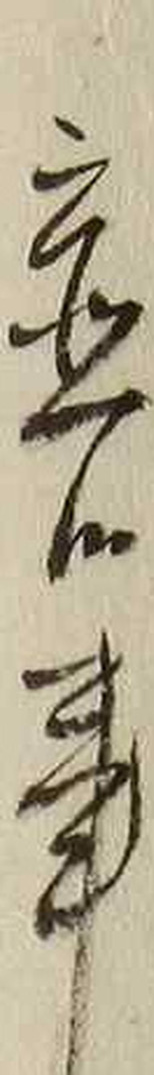置候事
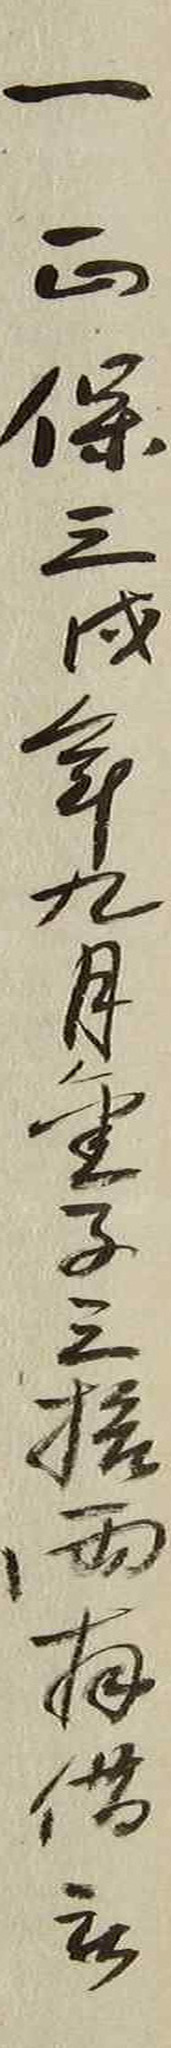一正保三戌年九月金子三拾両拝借被
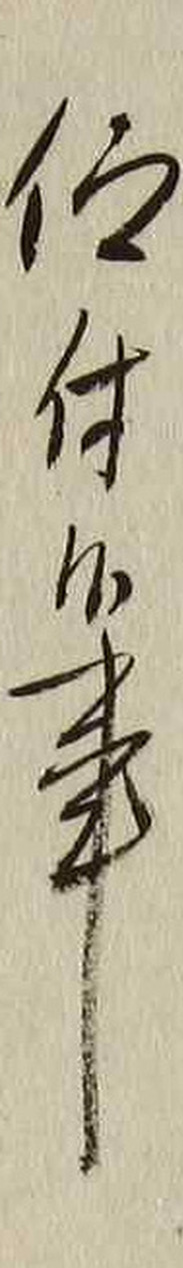仰付候事
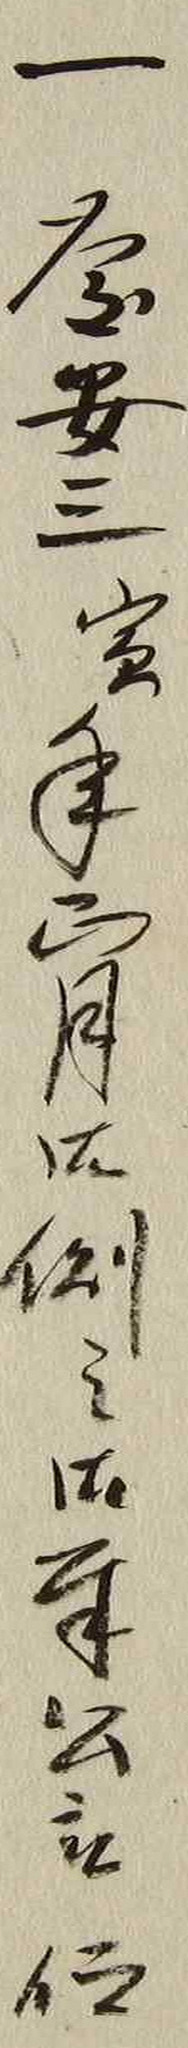一慶安三寅年正月御側之御奉公被仰
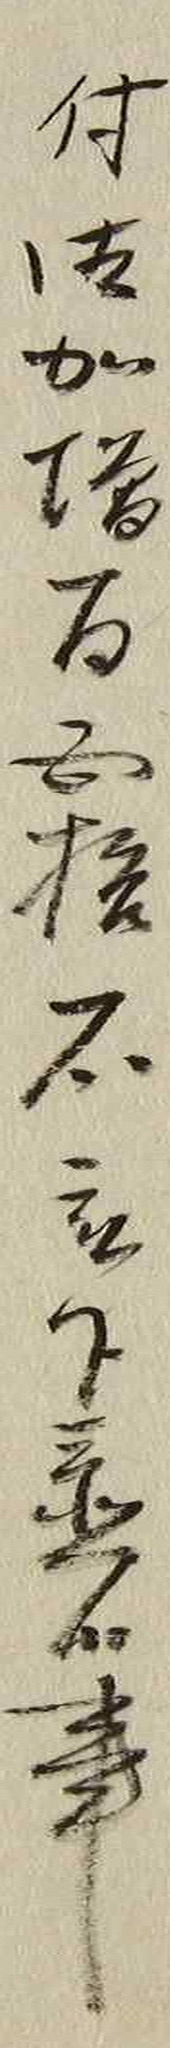付御加増百五拾石被下置候事
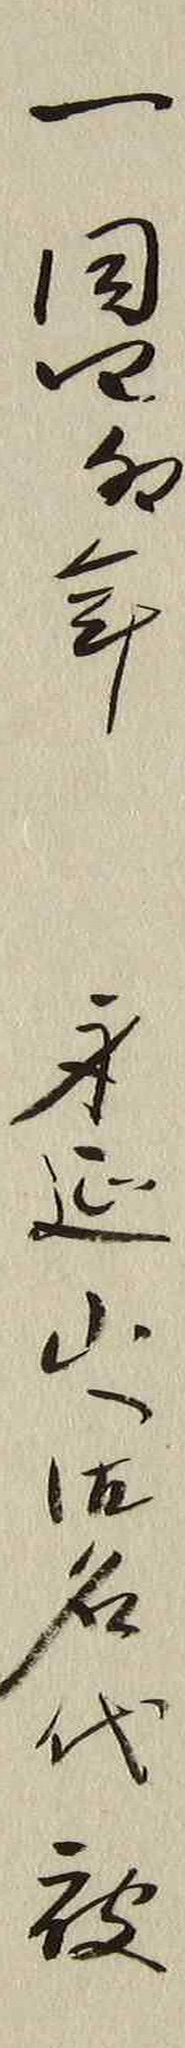一同四卯年身延山へ御名代被
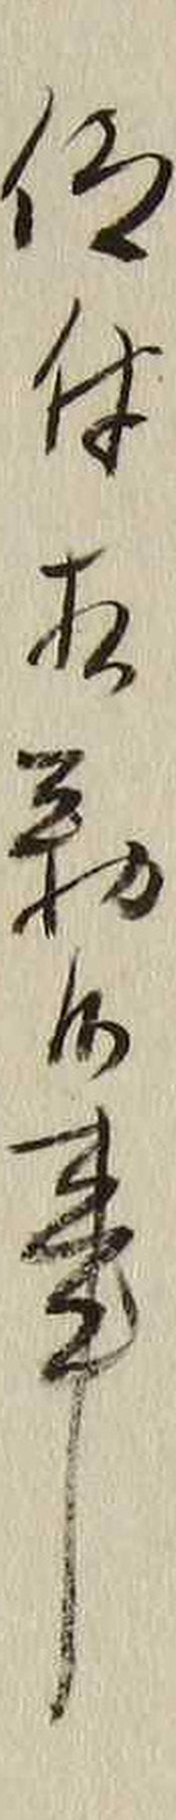仰付相勤候事
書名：諸士系譜　巻之351　す之部1
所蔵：会津若松市立会津図書館
